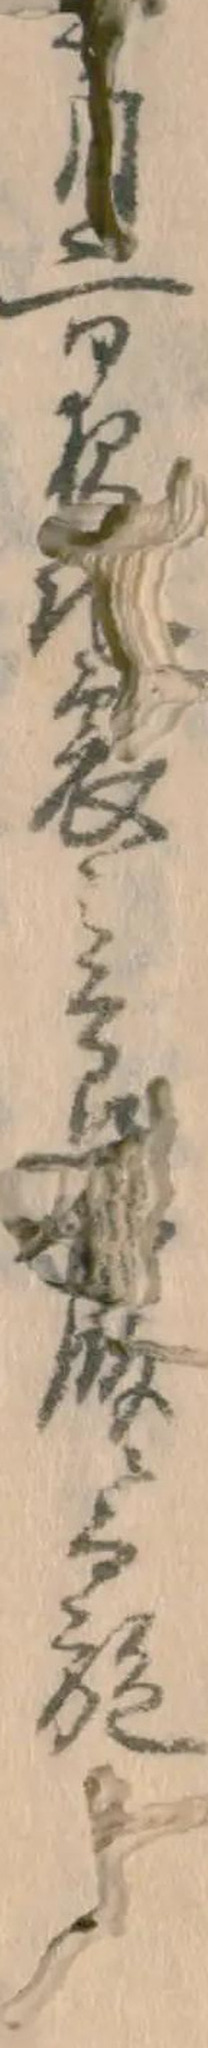十月二日夜地震之節粥飯ニ而施
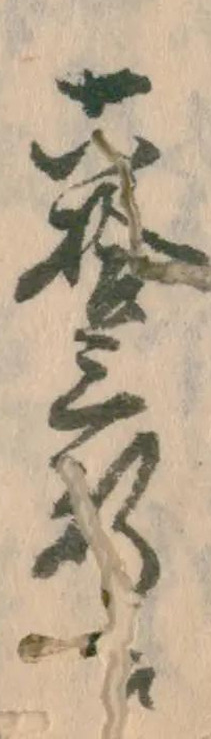六拾三軒
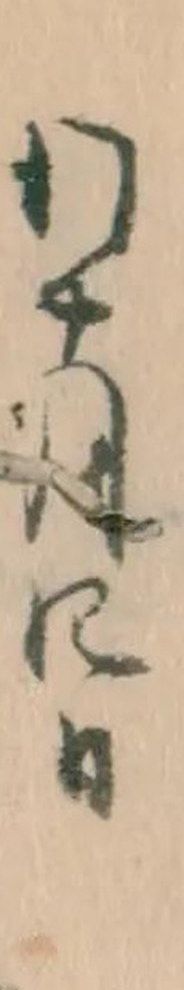同十月四日
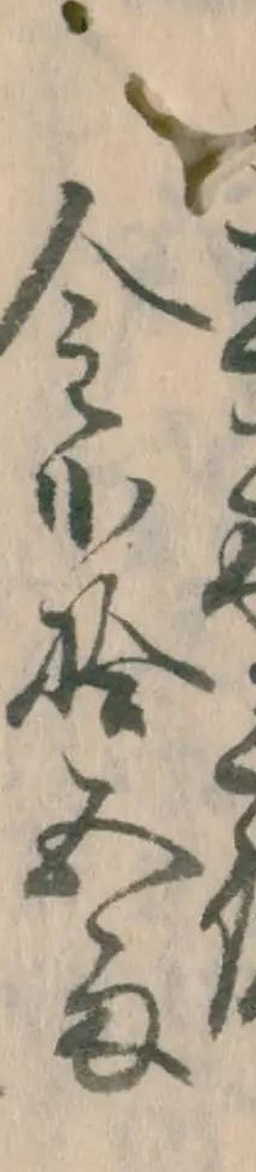金弐拾五両
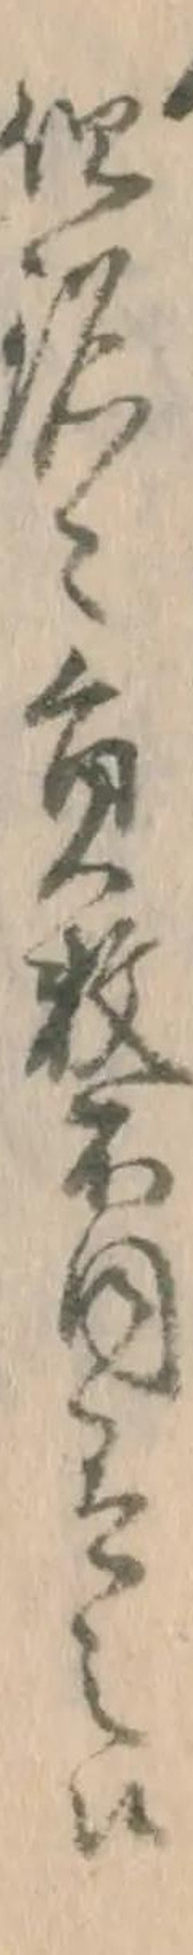但銘々員数不同有之候
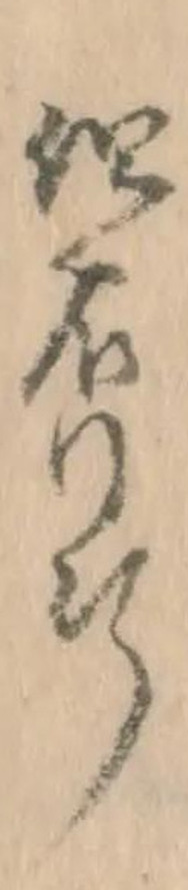但右同断

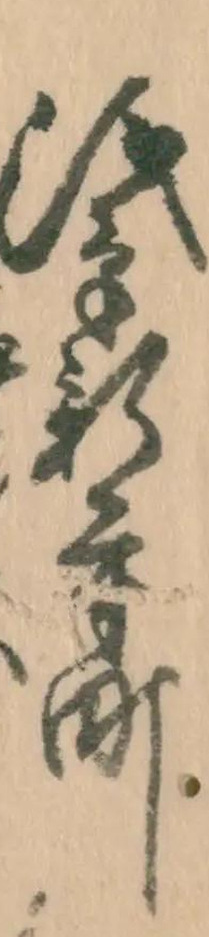浅草新寺町
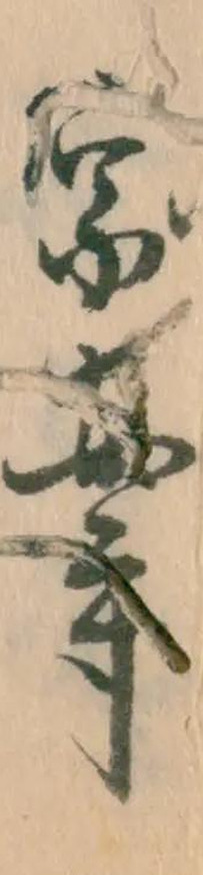宗安寺
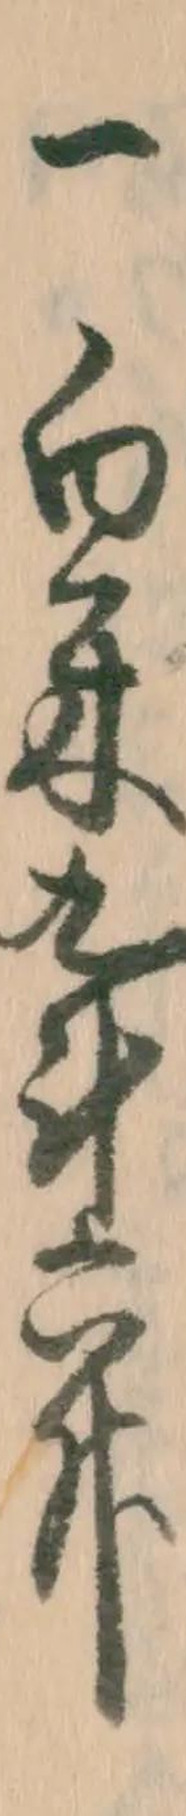一白米九斗六升店
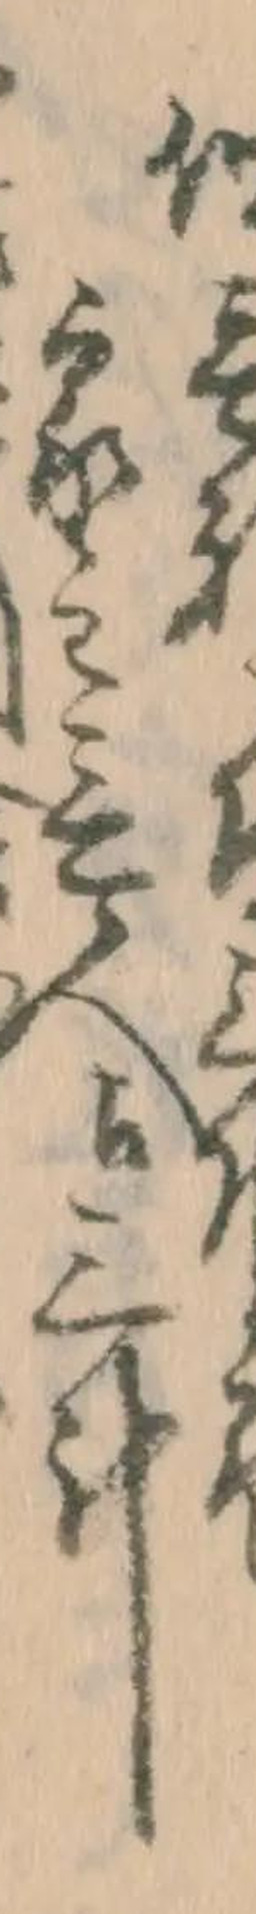家主壱人え三斗
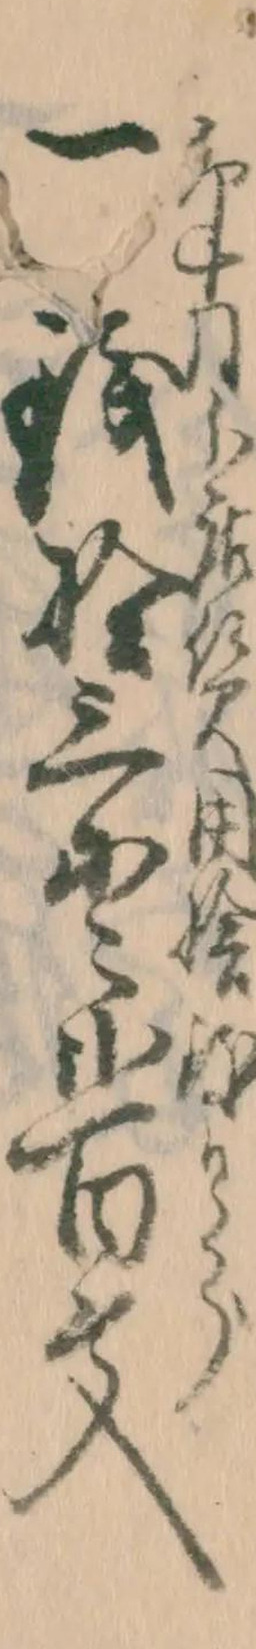一銭拾三貫弐百文
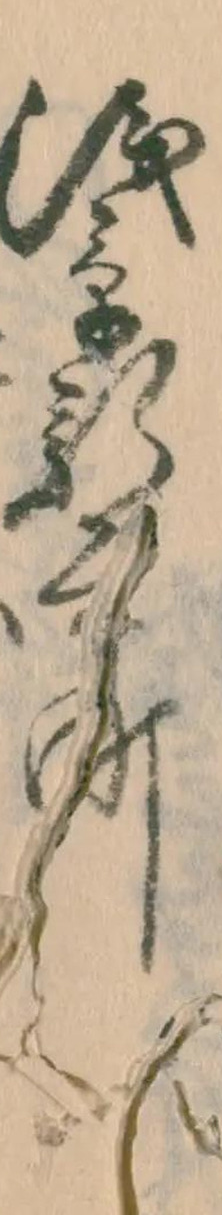浅草新寺町
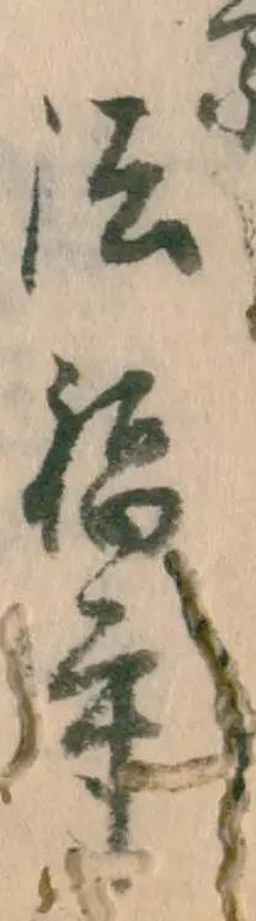法福寺
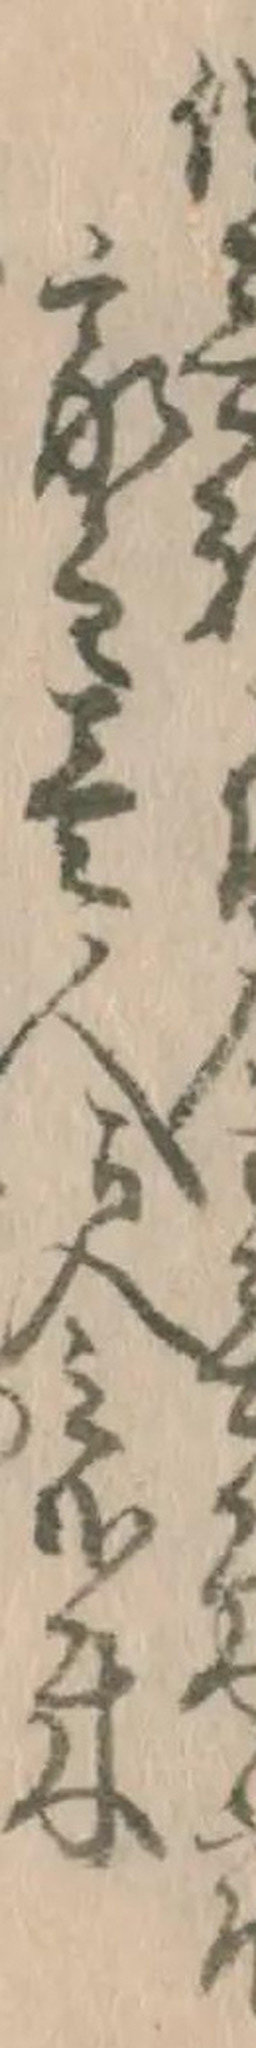家主壱人え金弐朱
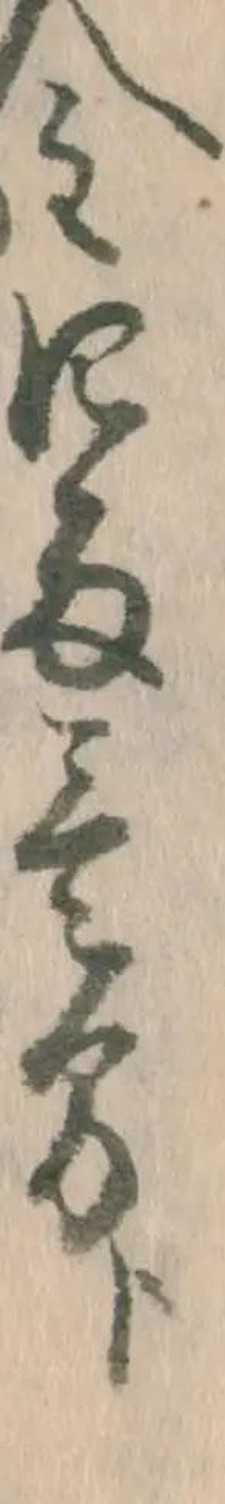一金四両壱分ト
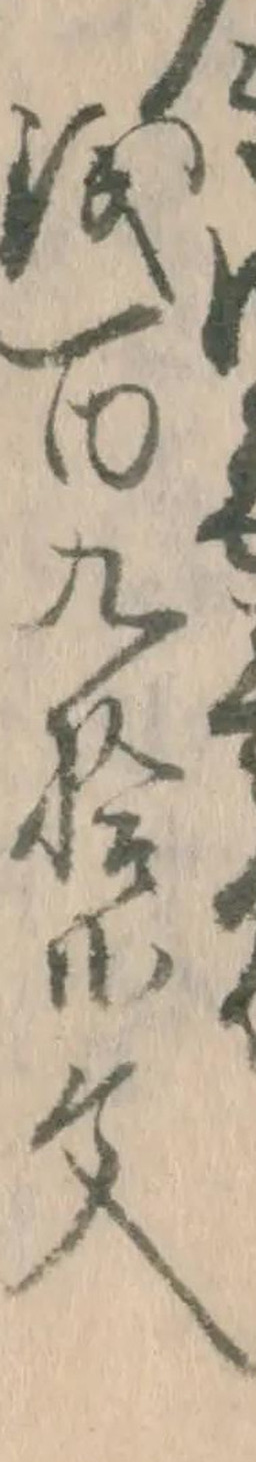銭百九拾弐文
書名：武家方并寺院等ニテ施差出候一件
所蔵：国立国会図書館 National Diet Library, JAPAN
